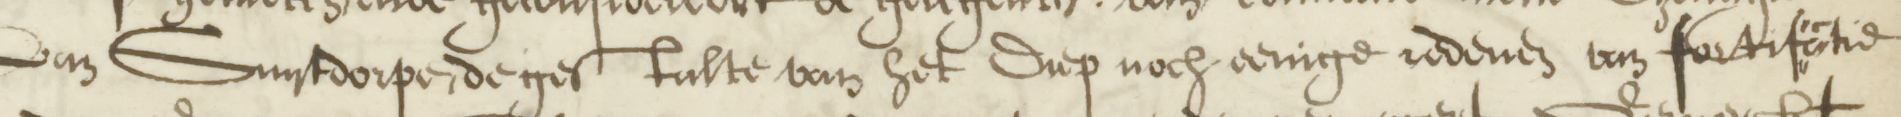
van Suytdorpe, de gestalte van het Diep noch eenige redenen van fortificatie
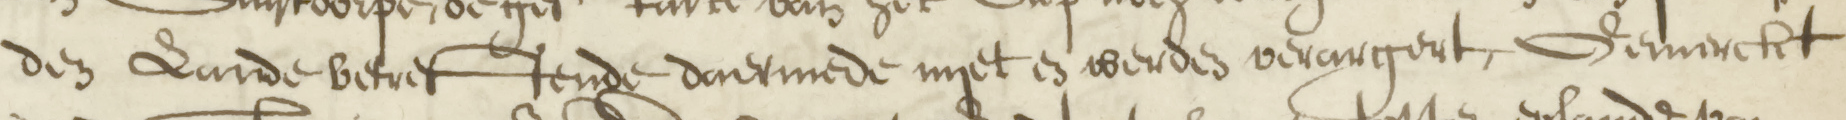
den Lande betreffende daermede nyet en werden verargert. Gemerckt
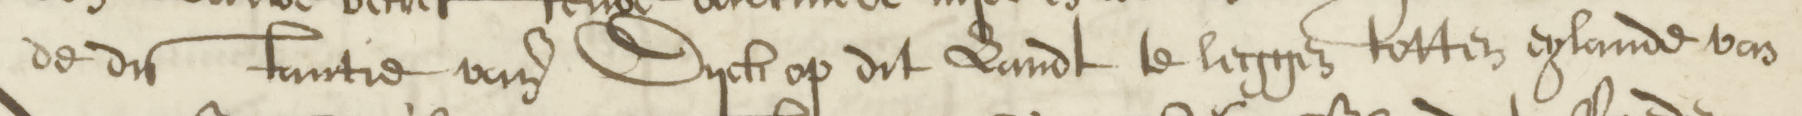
de distantie van Dyck op dit Landt te leggen totten eylande van
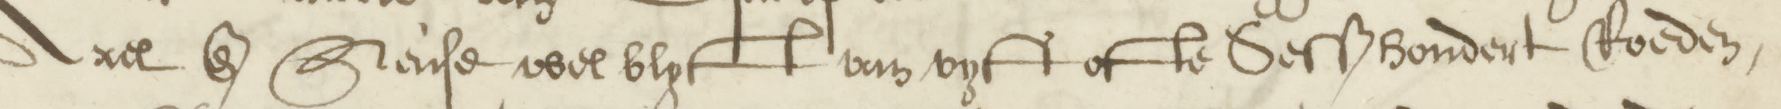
Axel & Neuse wel blyft van vyff ofte Sess hondert Roeden,
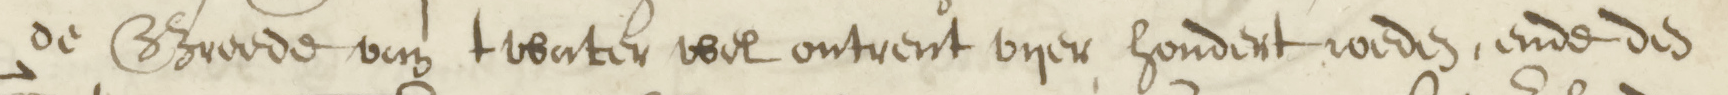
de Breede van twater wel ontrent vyer hondert roeden, ende den
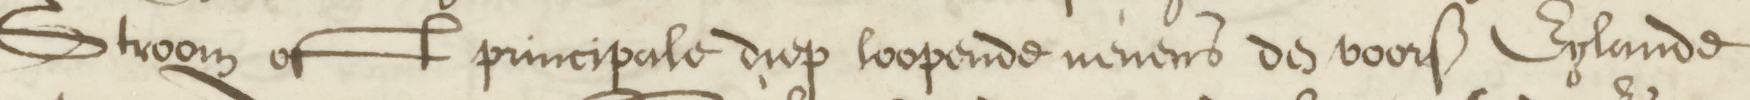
Stroom oft principale diep loopende neuens den voors Eylande
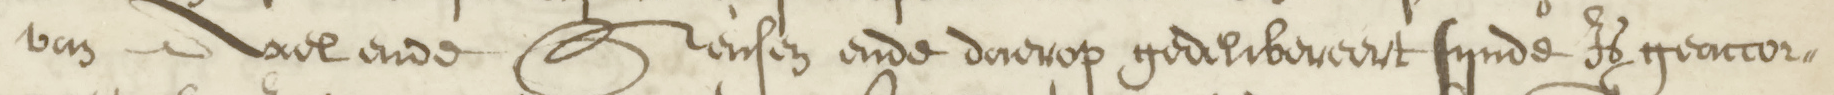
van Axel ende Neusen ende daerop gedelibereert synde Is geaccor„
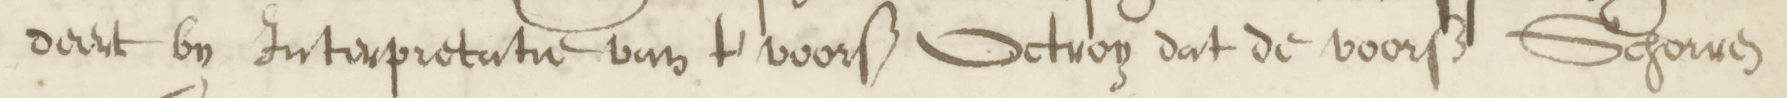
deert by Interpretatie van t'voors Octroy dat de voors Schorren
